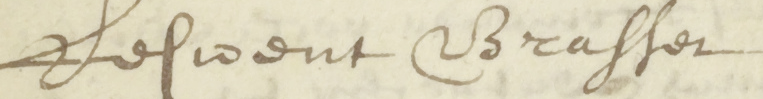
Resident Brasser
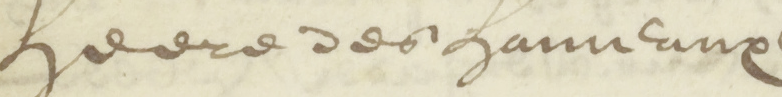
Heere des Hameaux
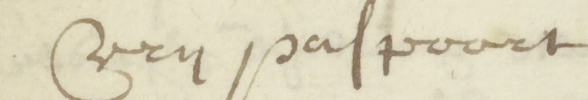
vrij paspoort
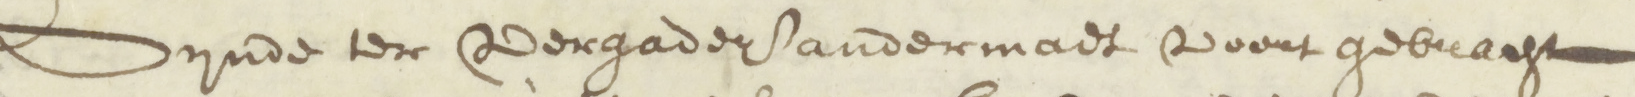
Sijnde ter Vergader andermael voort gebracht
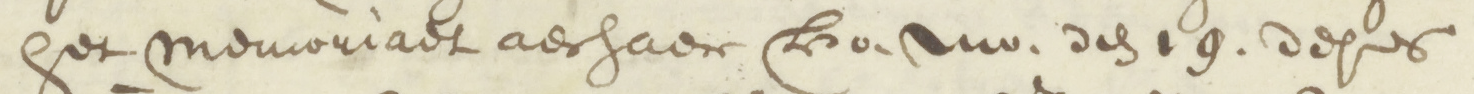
het memoriael aen haer Ho.Mo. den 19. deses
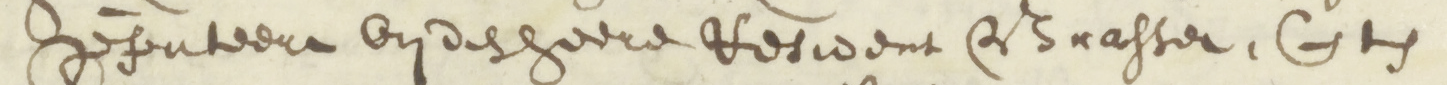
gepnteert by den heere Resident Brasser, & ten
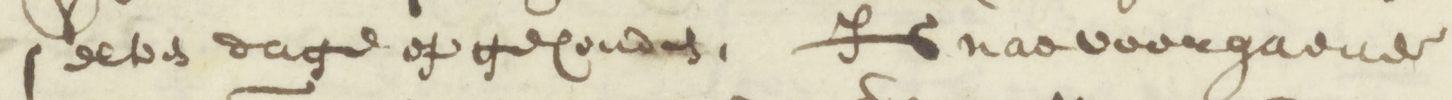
selven dage op gehouden. Is nae voorgaende
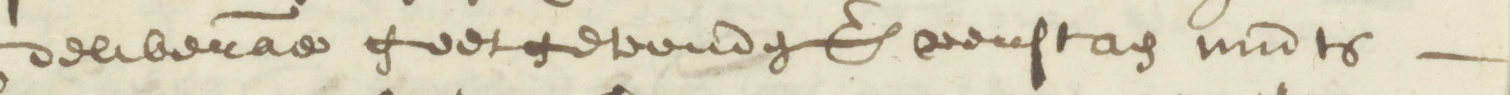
deliberae goet gevonden & verstaen midts —
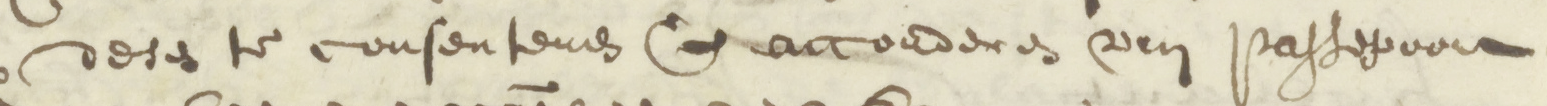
desen te consenteren & accorderen vrij passepoort
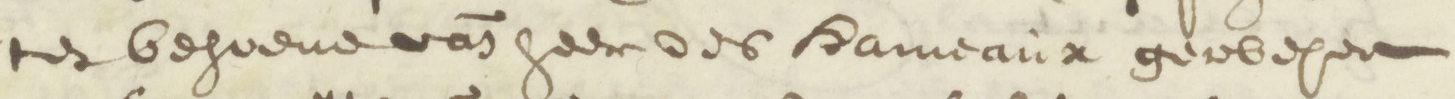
ten behoeve van heer des Hameaux gewesen
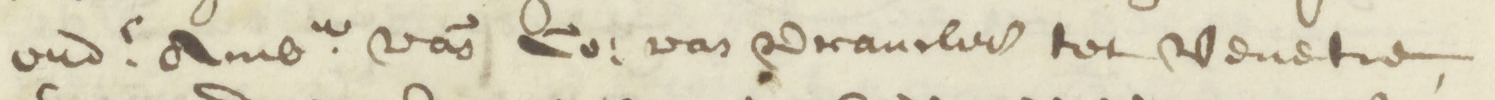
ords. Ambr. van Co: van Vranckr tot Venetie
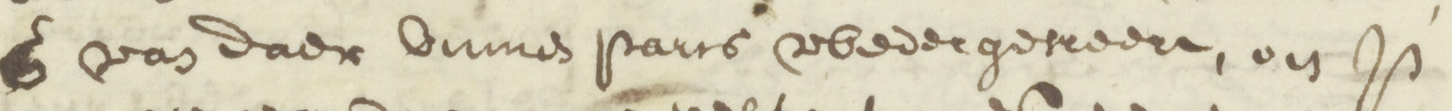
& van daer binnen paris wedergekeert, om in
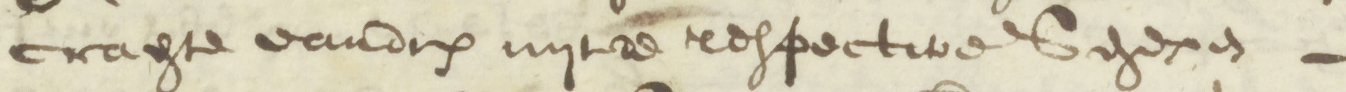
crachte vandien uijt de respective Schepen -
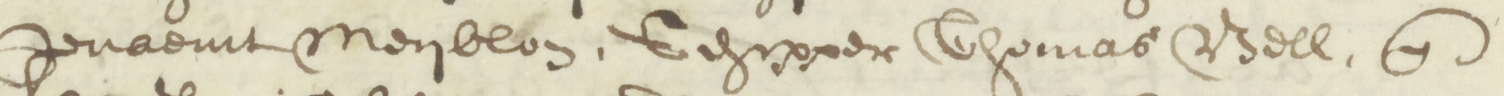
genaemt Meyblom, Schipper Thomas Bell, &
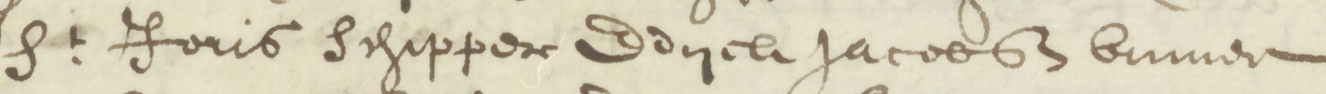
St. Joris Schipper Edyck Jacobsz binnen
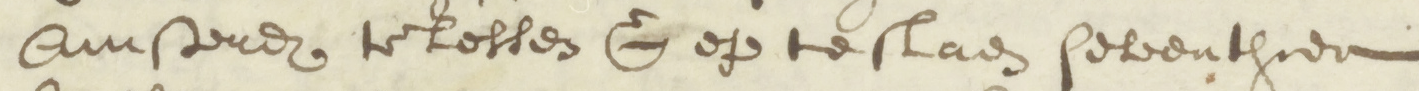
Amsterdam te lossen & op te slaen seventhien
